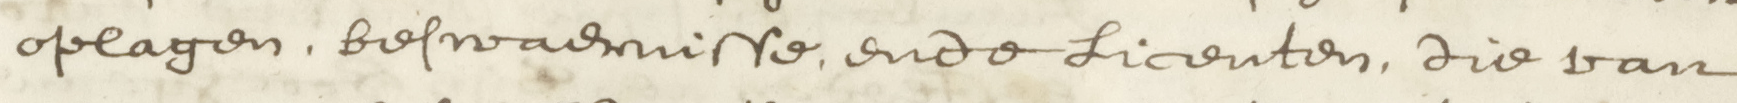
oplagen, beswaernisse, ende Licenten, die van
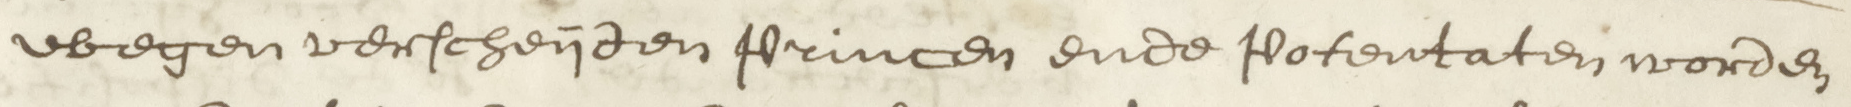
wegen verscheijden Princen ende Potentaten worden
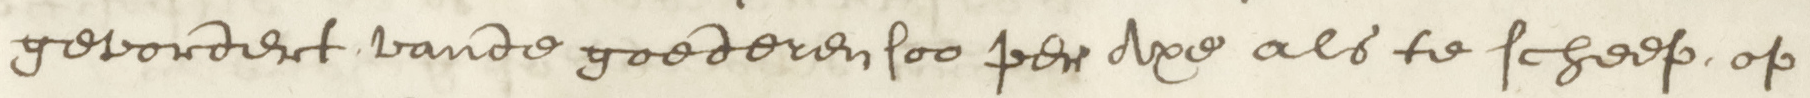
gevordert vande goederen soo per Axe als te scheep, op
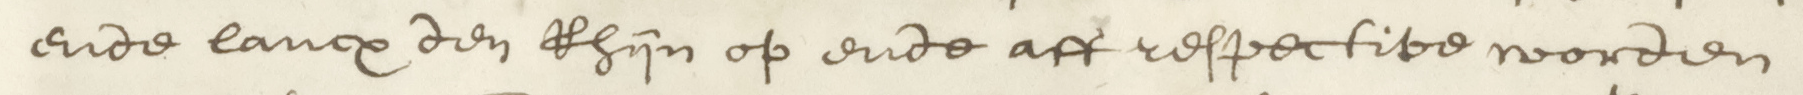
ende lancx den Rhijn op ende aff respective worden
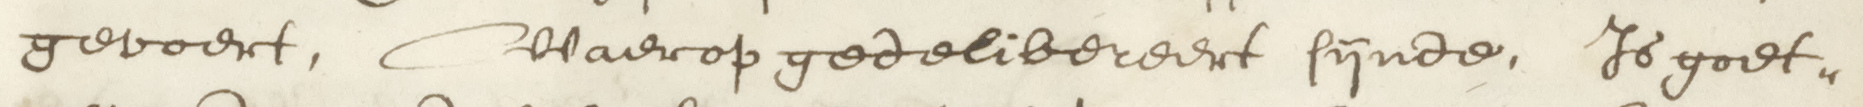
gevoert. Waerop gedelibereert sijnde, Is goet„
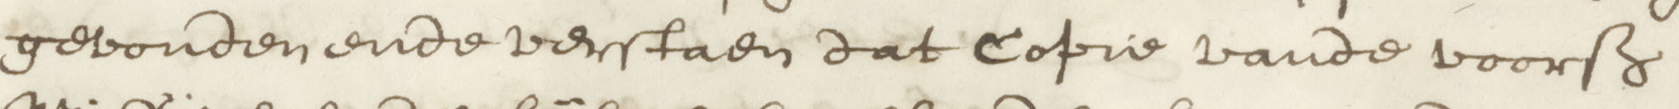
gevonden ende verstaen dat Copie vande voors
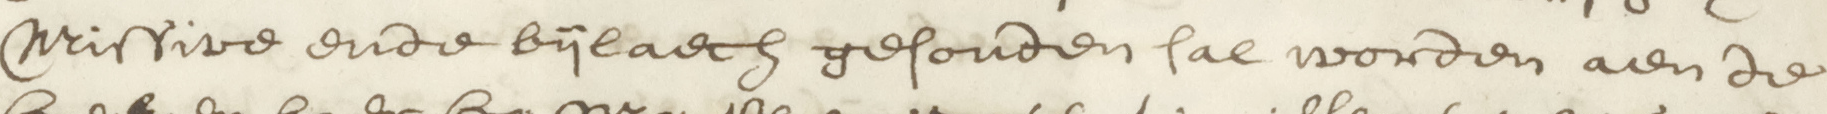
Missive ende bijlaech gesonden sal worden aen de
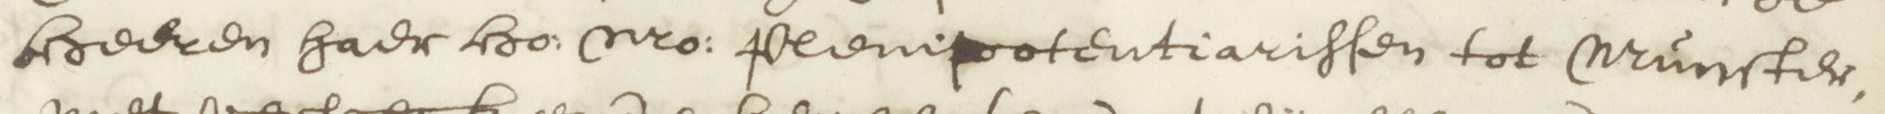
Heeren haer Ho:Mo: Plenipotentiarissen tot Munster,
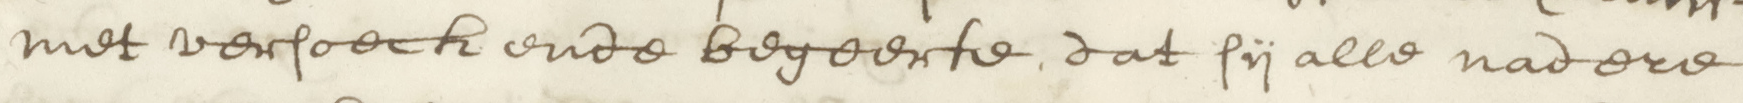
met versoeck ende begeerte, dat sij alle nadere
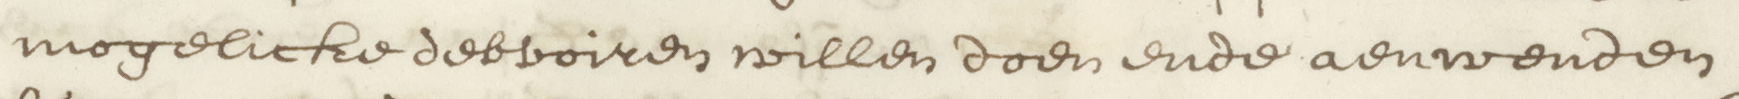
mogelicke debvoiren willen doen ende aenwenden
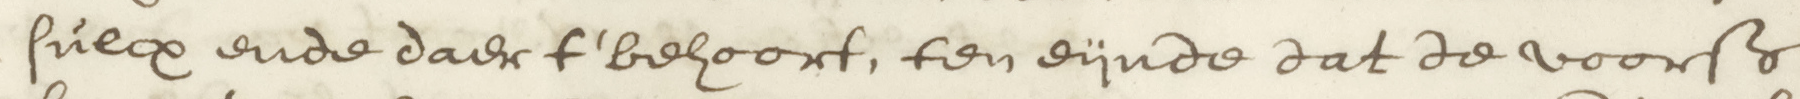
sulcx ende daer t'behoort, ten eijnde dat de voors
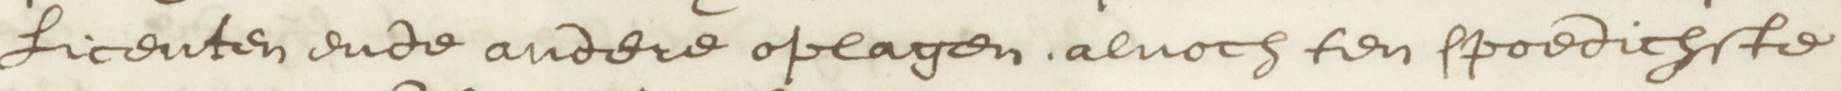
Licenten ende andere oplagen, alnoch ten spoedichste
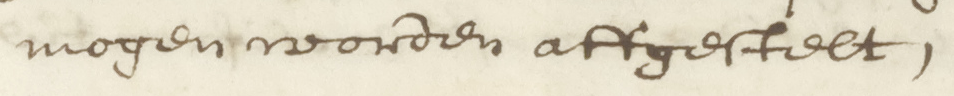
mogen worden affgestelt.
